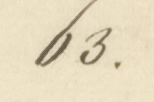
63.
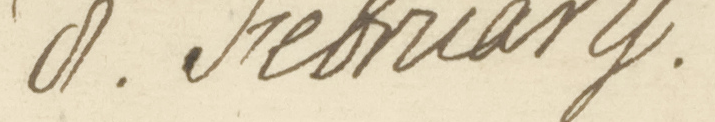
8. Februarij.
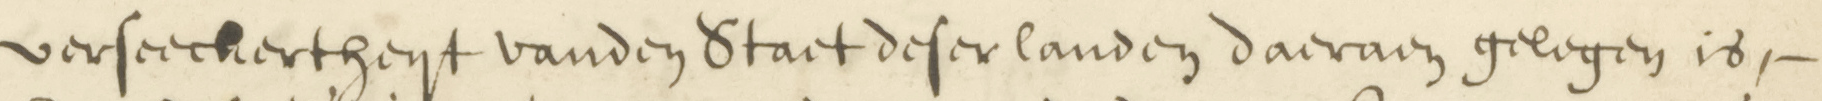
verseeckertheyt vanden Staet deser landen daeraen gelegen is, —
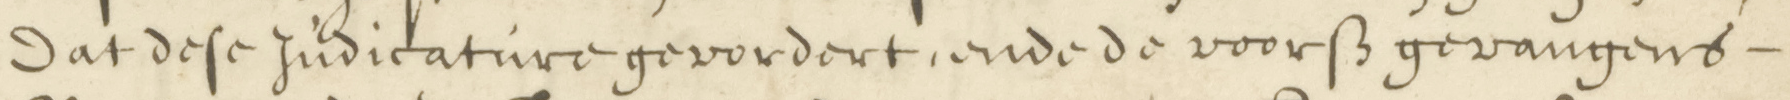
dat dese Judicature gevordert, ende de voors gevangens -
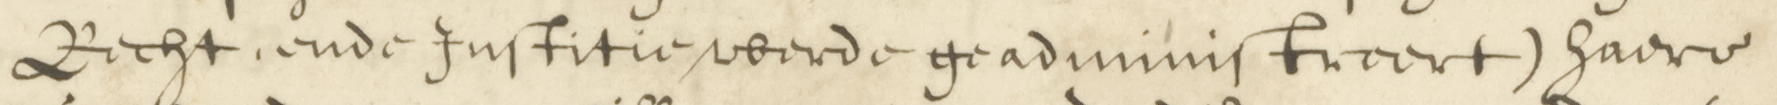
Recht, ende Justitie werde geadministreert) haere
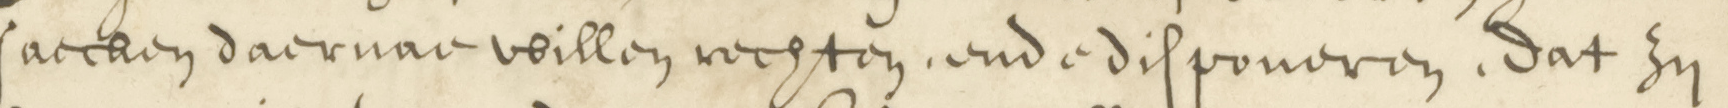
saecken daernae willen rechten, ende disponeren, dat zy
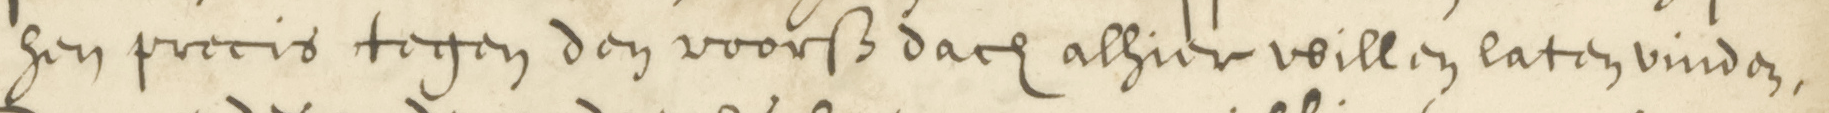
hen precis tegen den voors dach alhier willen laten vinden,
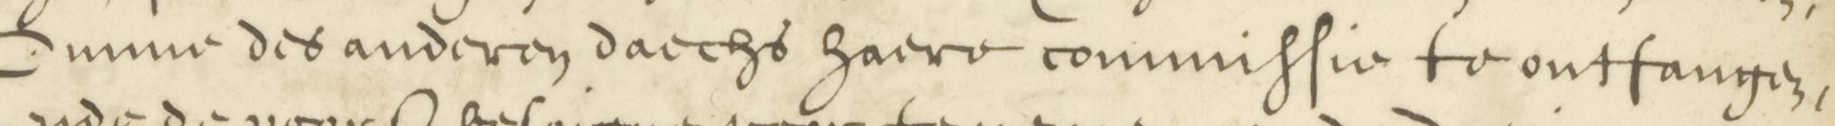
Omme des anderen daechs haere commissie te ontfangen,
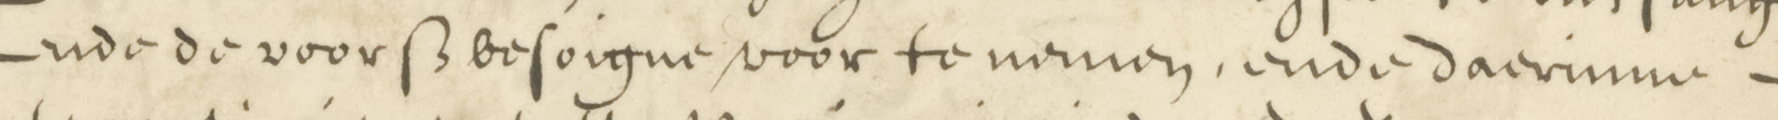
ende de voors besoigne voor te nemen, ende daerinne
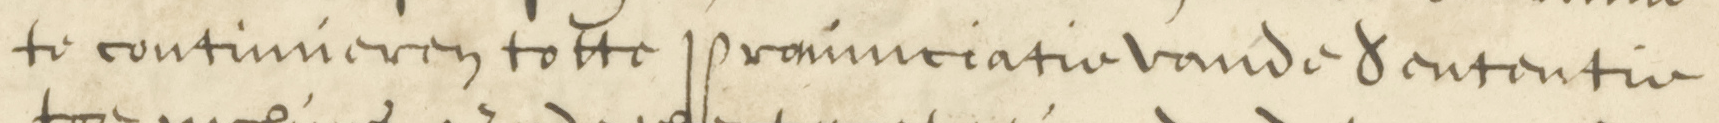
te continueren totte pronunciatie vande Sententie
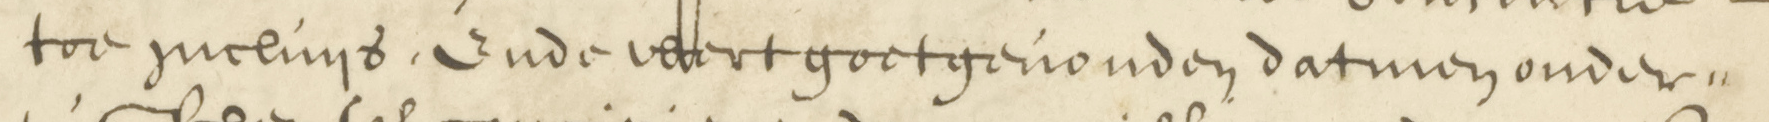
toe incluys. Ende wert goetgeuonden datmen onder„
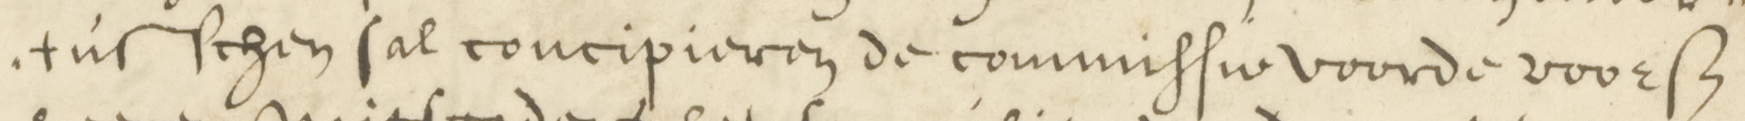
tusschen sal concipieren de commissie voorde voors
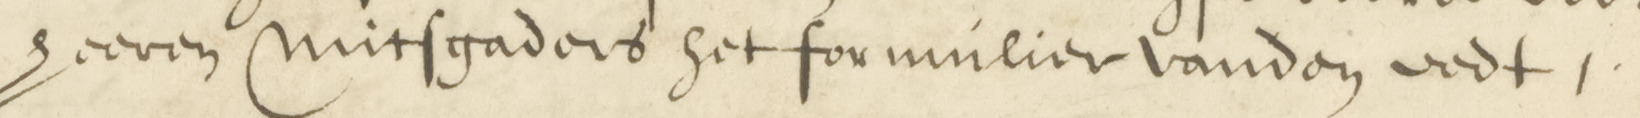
heeren mitsgaders het formulier vanden eedt.
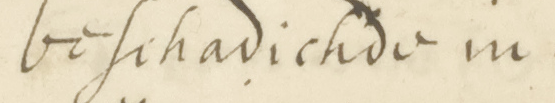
beschadichde in
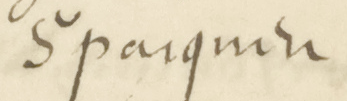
Spaignen
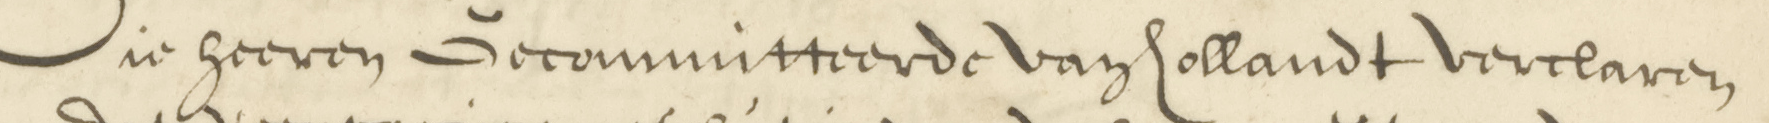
Die heeren Gecommitteerde van Hollandt verclaren
